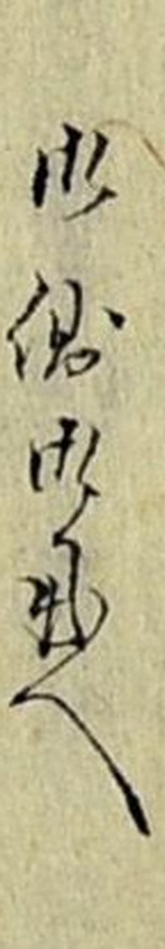御側御用人
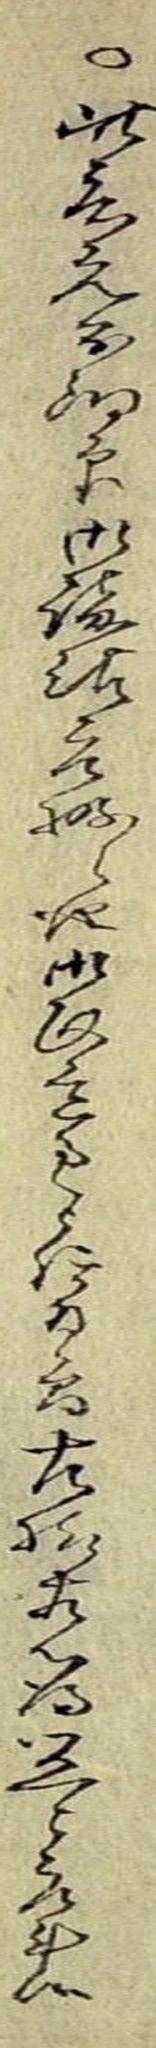○此度元分銅印御講銀取扱候儀御趣意方被仰付候間左様相心得宜被取斗候
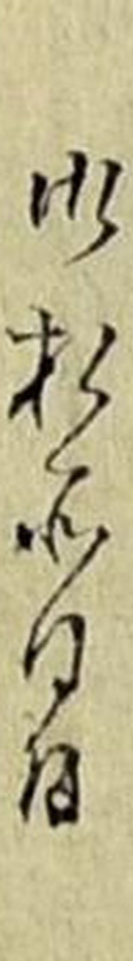御札所目付
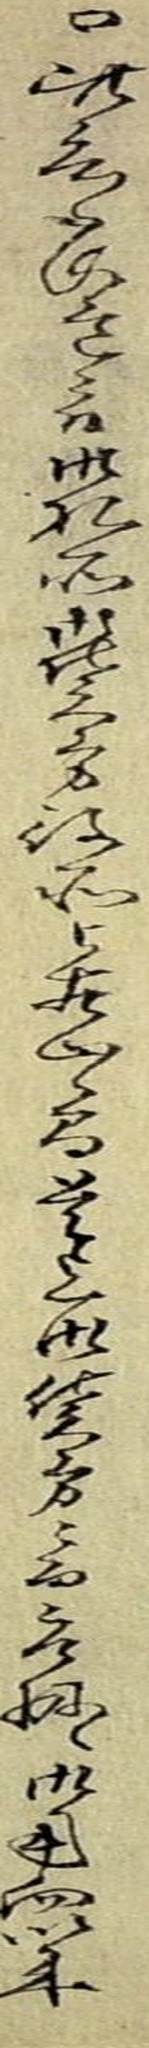○此度御趣意に付御札所御貸方役所被相止候間是迄御貸方に而取扱候御用向以來
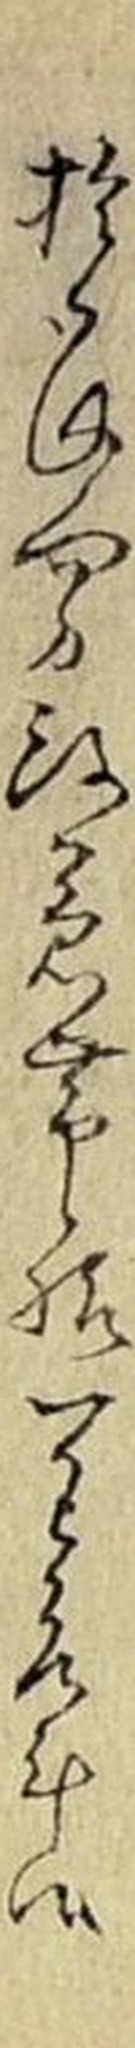於御趣向方致兼帯候様可被取斗候
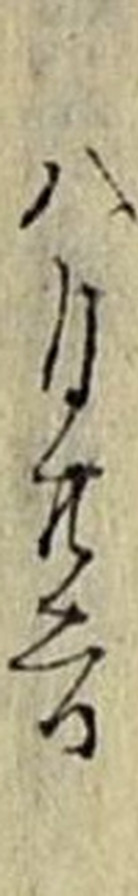八月廿二日
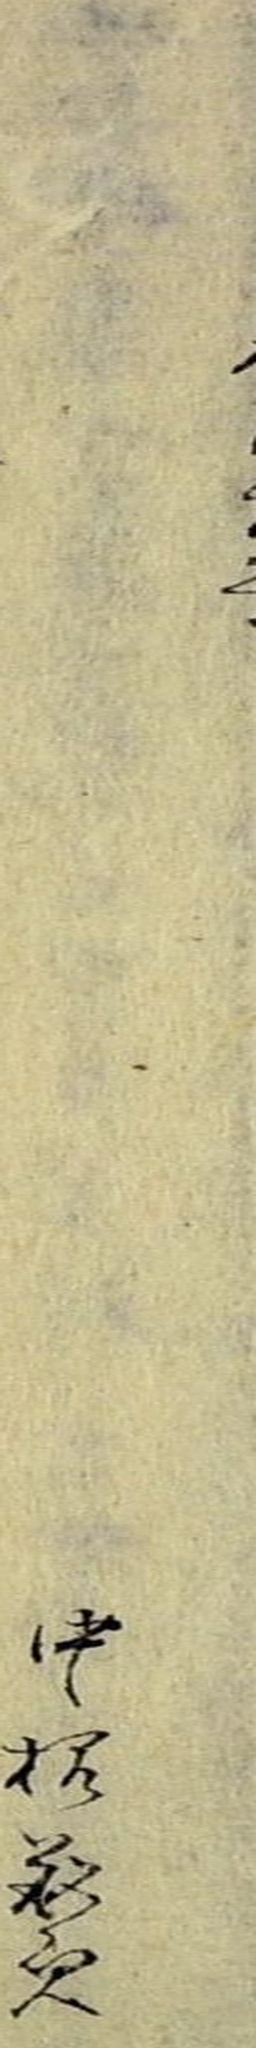中根靭負
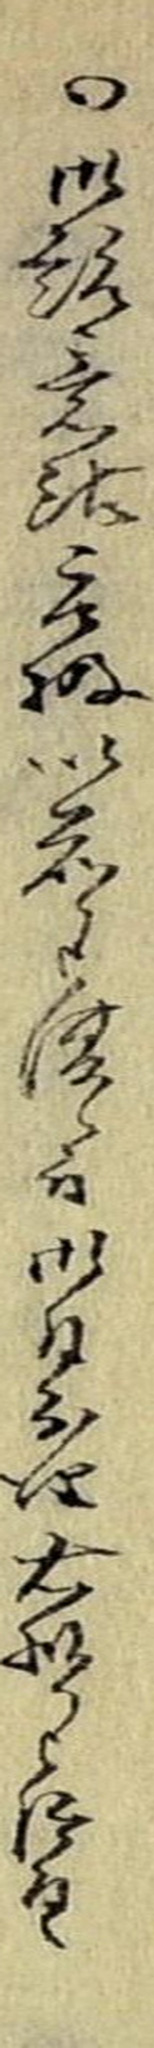○御趣意銀取扱以前へ復候に付御自分儀右掛り被仰付候
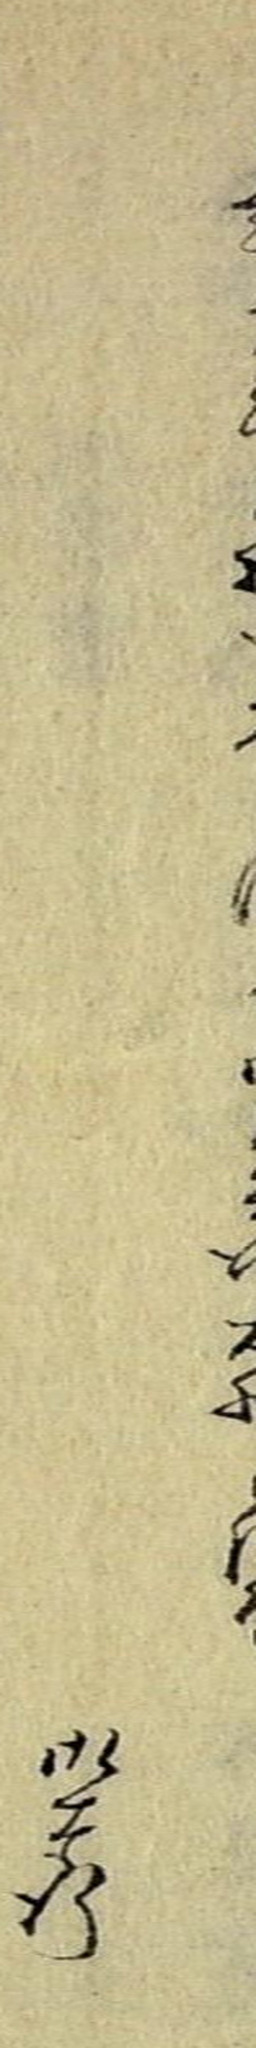御奉行
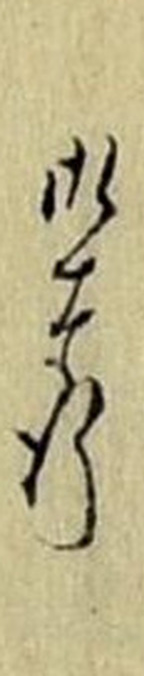御奉行
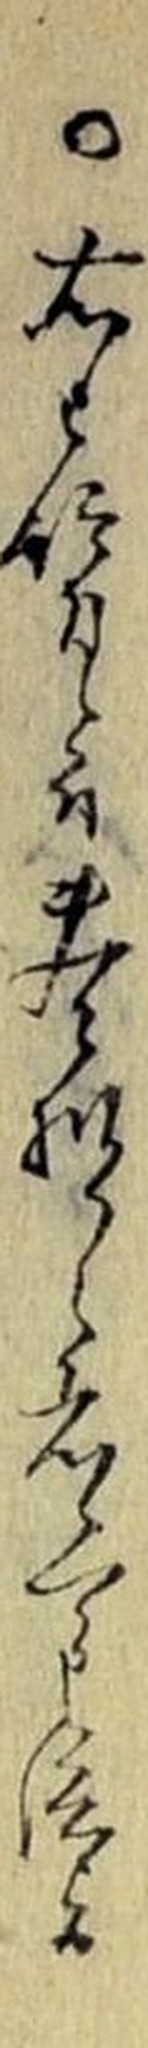○右被仰付候に付夫々掛り之者へ可申渡旨
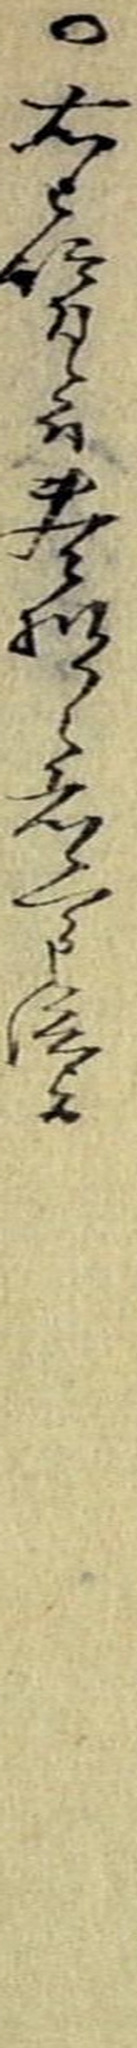○右被仰付候に付夫々掛り之者へ可申渡旨
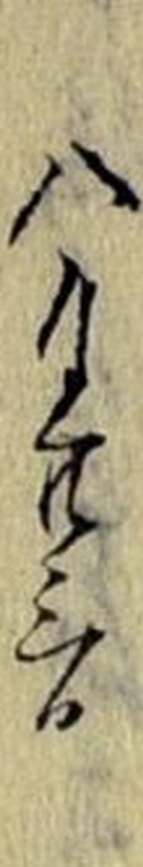八月廿三日
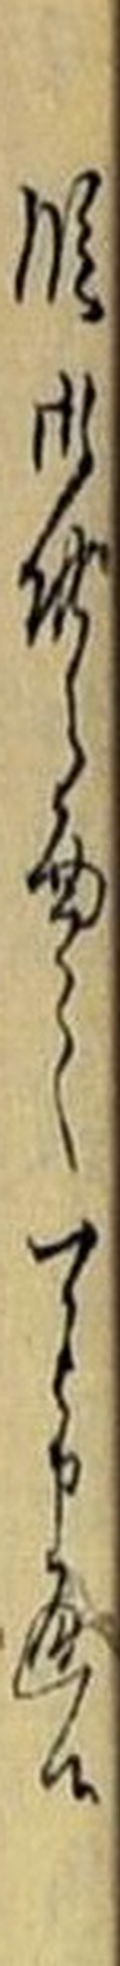段御供之面々可被申通候
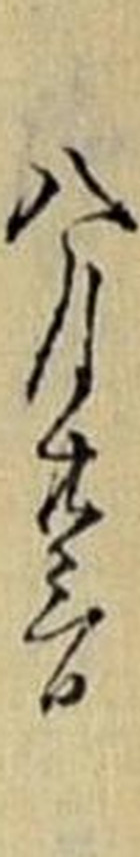八月廿三日
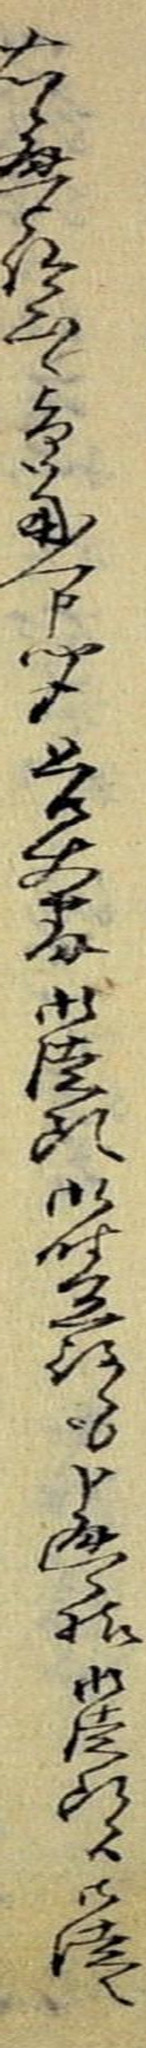右之通被仰出候旨御用人申聞且御使番御徒頭御時宜役へも申通候様御徒頭は御徒之
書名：命令之部 六
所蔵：福井県文書館 Fukui Prefectural Archives
